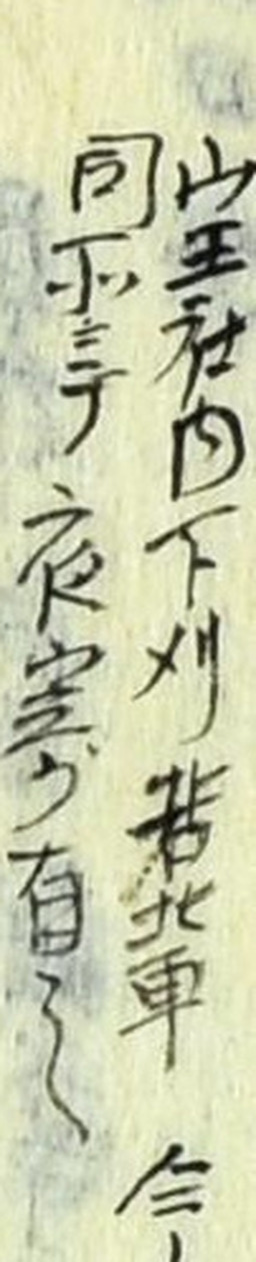堂所ニテ夜寄有之
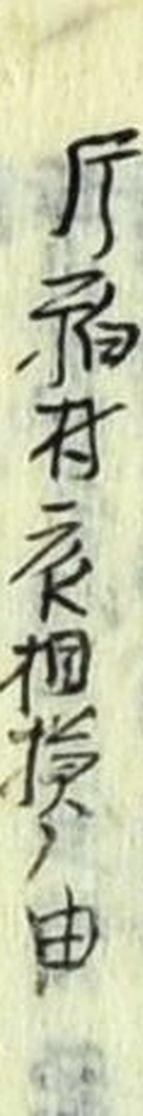片粕村夜相撲ノ由
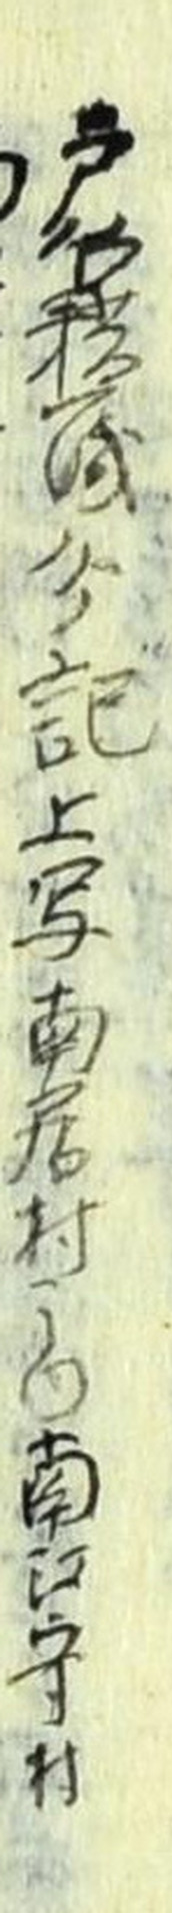戸籍職分記上写南居村之内南江守村
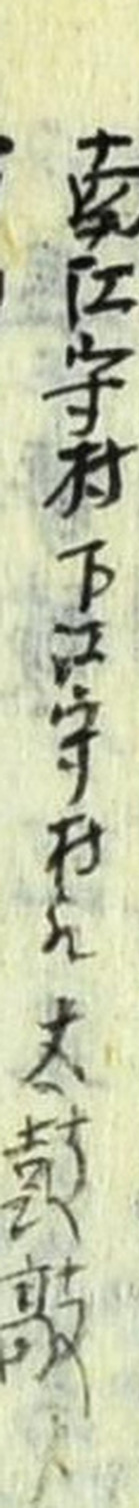南江守村下江守村歟太鼓敲候
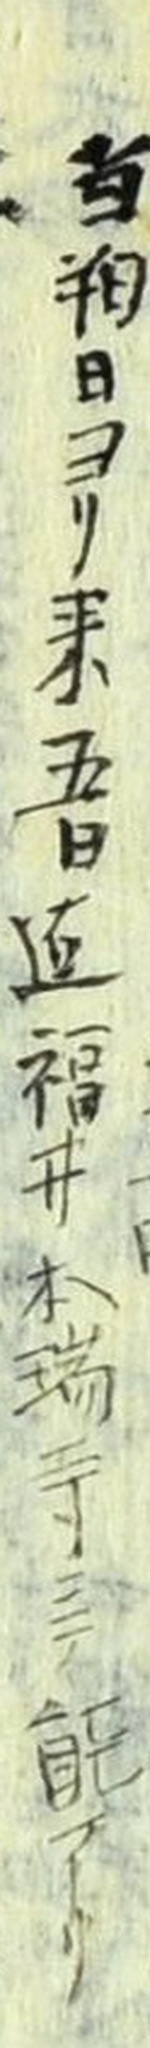当朔日ヨリ来五日迄福井本瑞寺ニテ能アリ
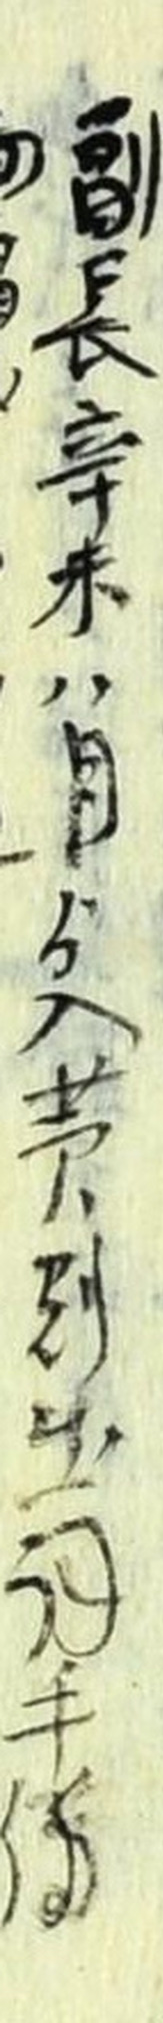副長辛未八月ゟ入費割出調手伝
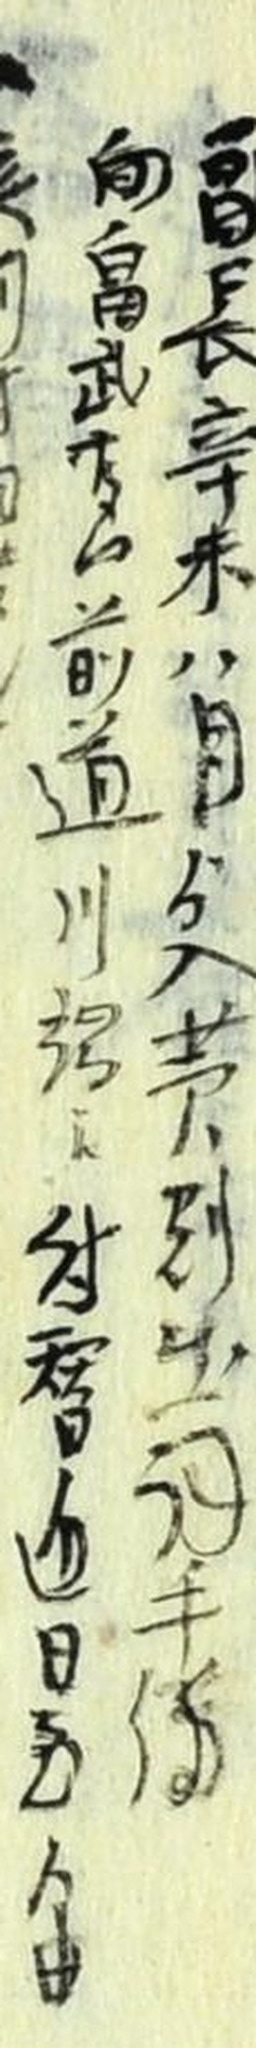向畠武左衛門前道川端江付替近日致候由
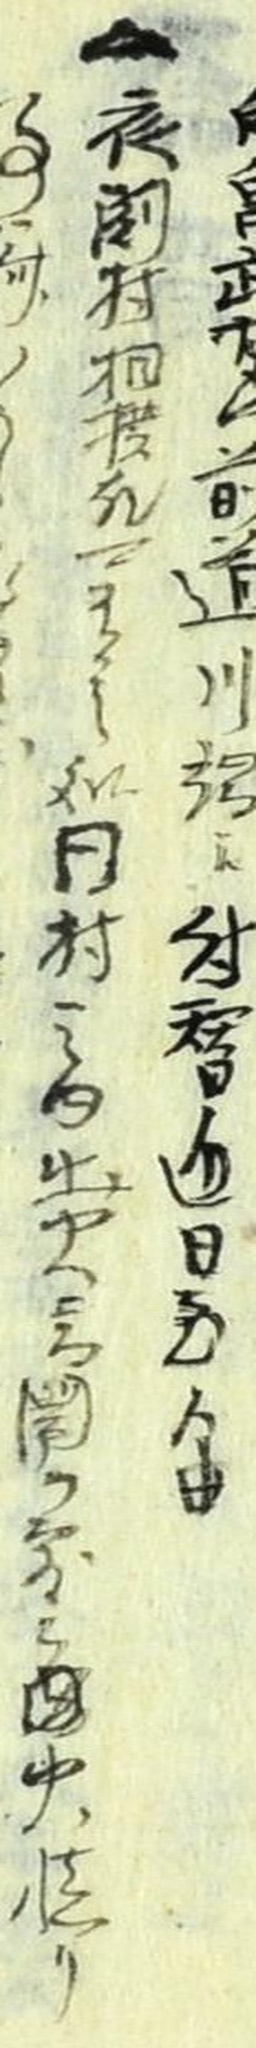△夜淵村相撲歟可有之処同村之内出火ニ而閙ヶ敷候内被慎リ
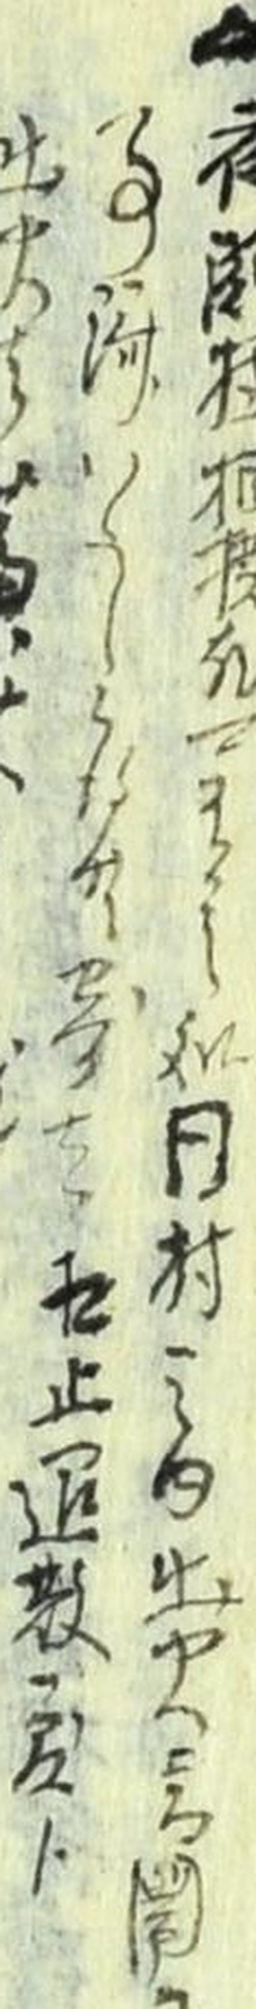事済いたし候得共寄者相止退散致候
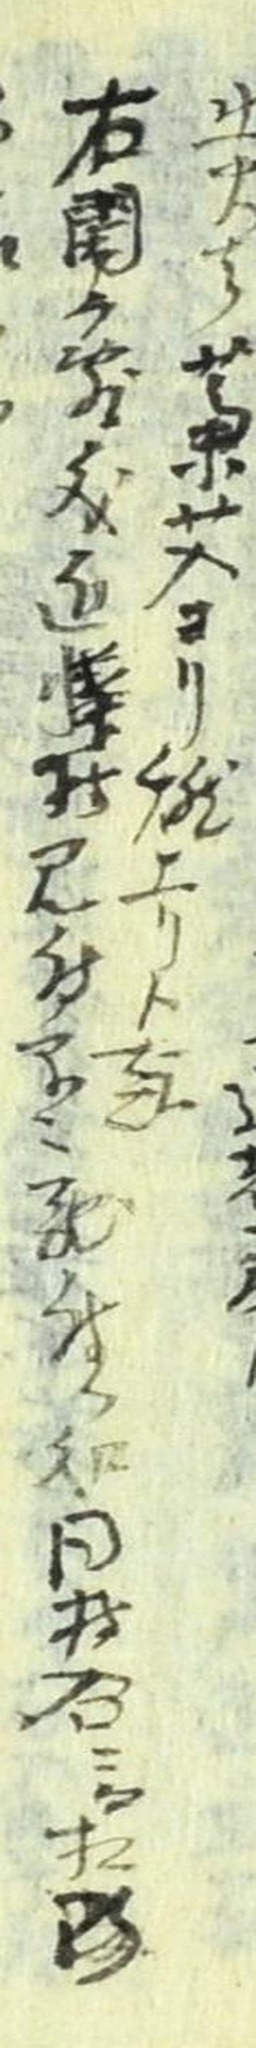右閙ヶ敷義近憐村見付早々馳付候処同村入口ニ而相断
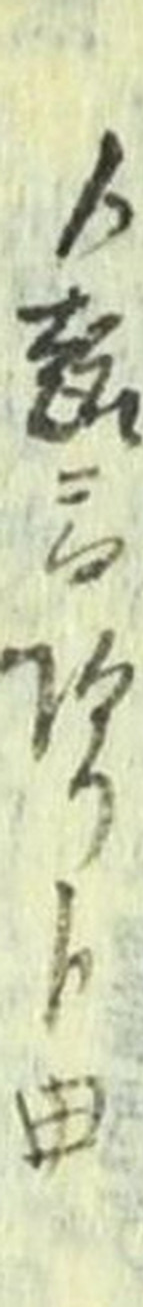候趣ニ而帰リ候由
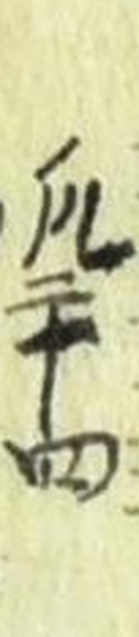瓜二十四
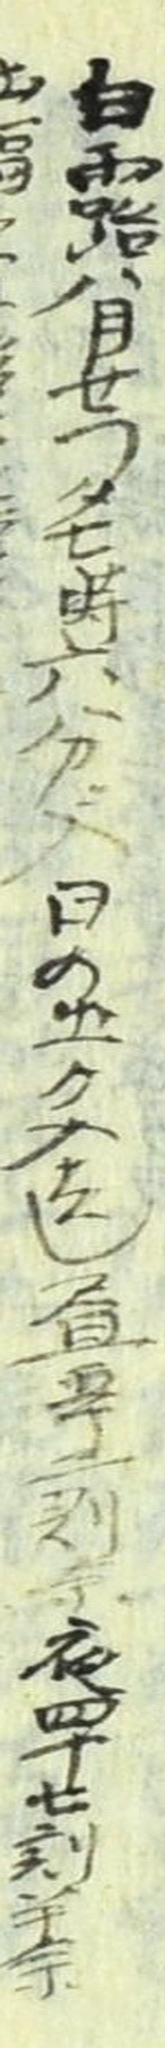白露八月せつ夕七時六分ニ入日の出夕入迄昼五十二刻余夜四十七刻半余
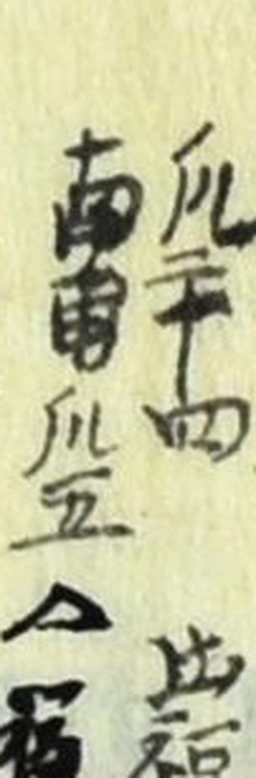南甫瓜五」
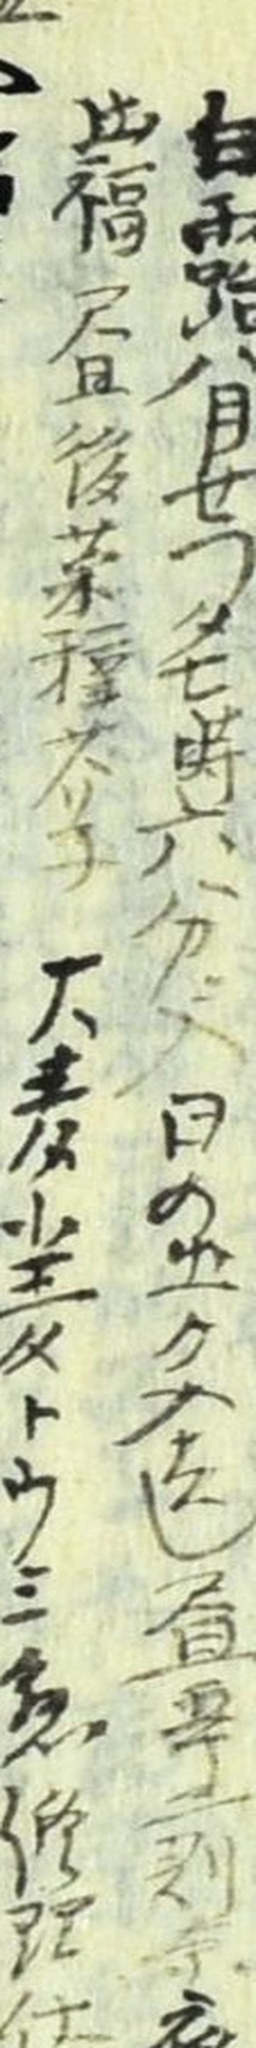出福昼後菜種芥子大麦小麦トウミ懸修理仕
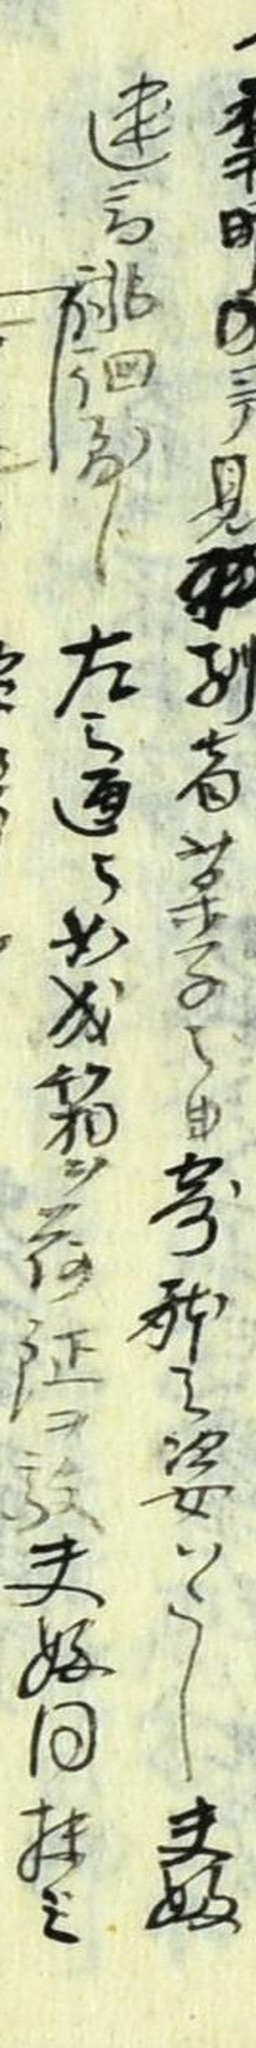連ニ而徘徊致し左之通ニ如成る箱ヲ荷鉦ヲ敲夫婦同様之
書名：（日記）
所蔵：福井県文書館 Fukui Prefectural Archives
